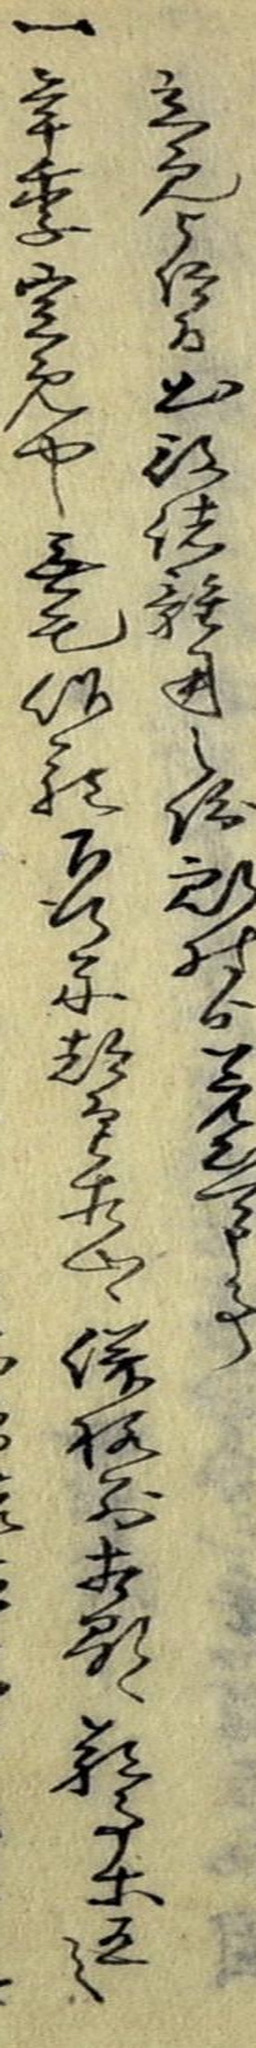一年季定免中無毛作難下行米都而被相止候併格別相願候難事等有之
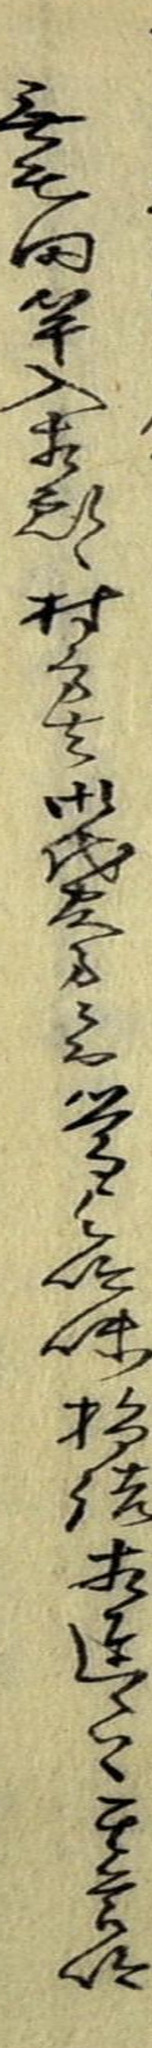無毛田竿入相願候村方者御代官方ニ而篤与吟味指詰相達候ハヽ其節吟
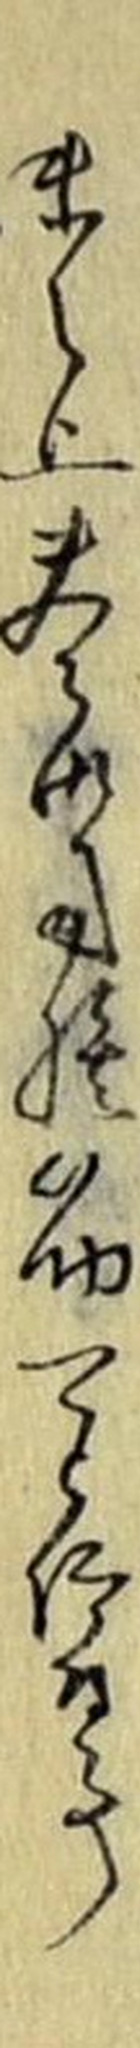味之上夫々御用捨筋可被仰付事
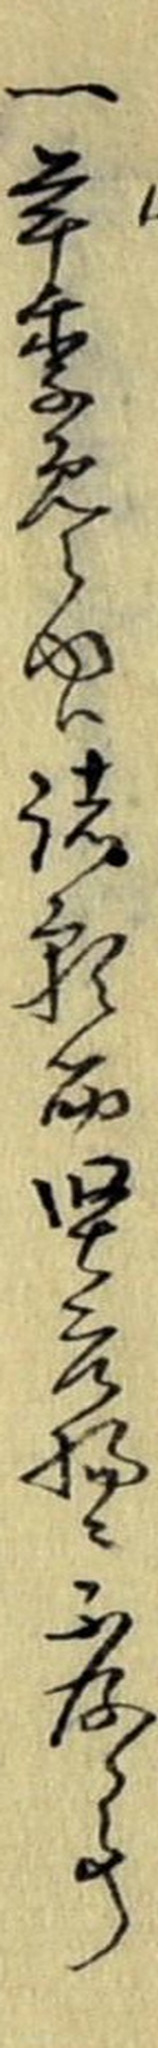一年季免之内ハ諸願筋堅取揚ニ不及候事

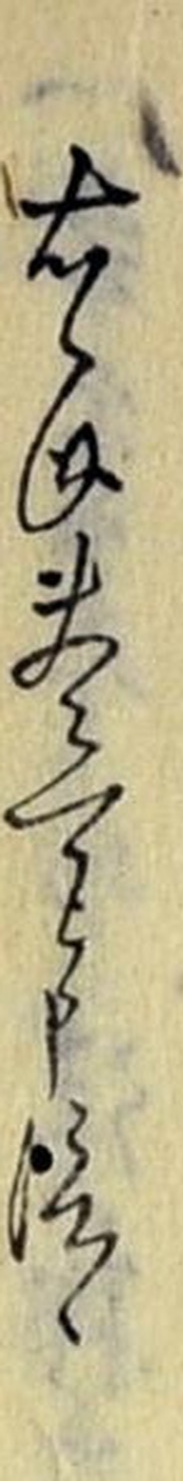右之趣夫々可被申渡候
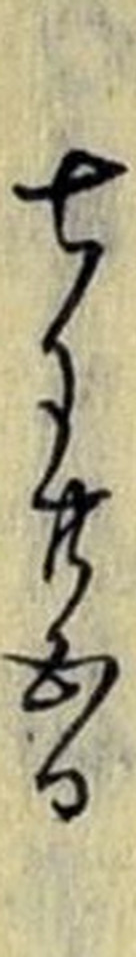七月廿五日
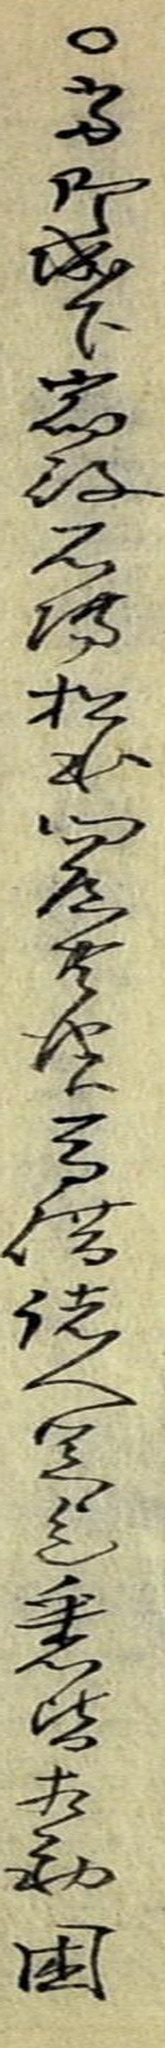〇当御城下宿役石場松本問屋共儀ハ馬借諸人足迄悉皆相勤困
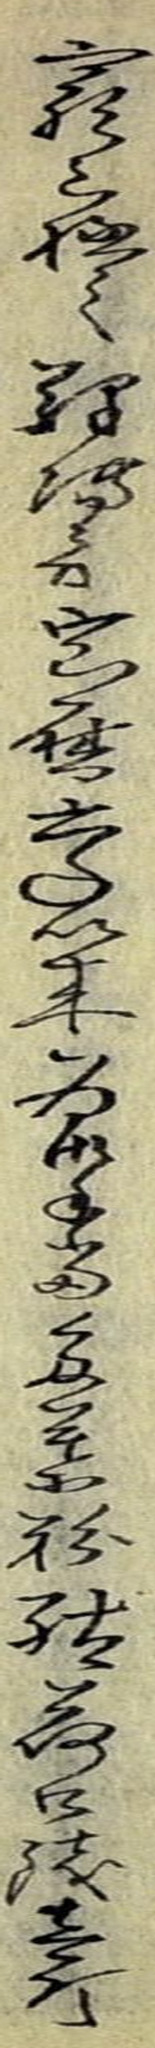窮至極之駅場ニ付宝暦六年以来為御手当た葉粉駄荷口銭壱斤
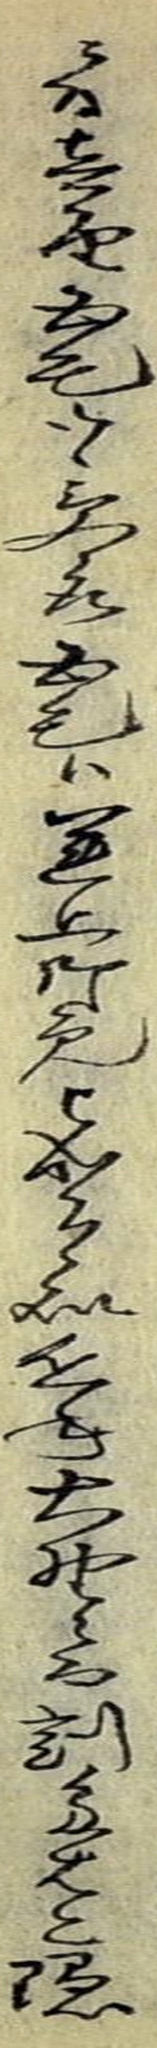ニ付壱厘五毛ツヽ受取五毛ハ運上御免被成下候処近年大野ニ而割たはこ隠
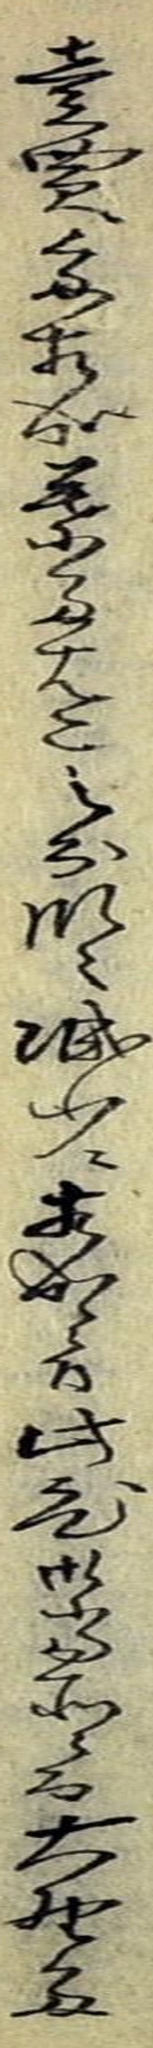売買多相成葉たはこ之分段々減少ニ相成候ニ付此度御当所ニ而大野た
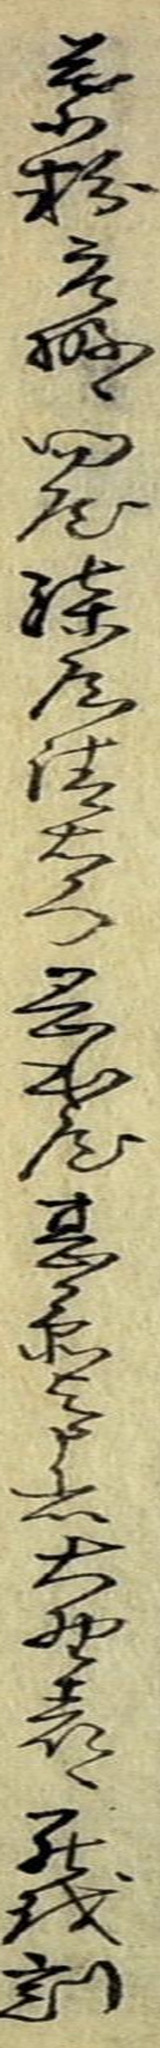葉粉取扱候問屋漆屋清右衛門岡本屋甚兵衛与申者大野表へ罷越割
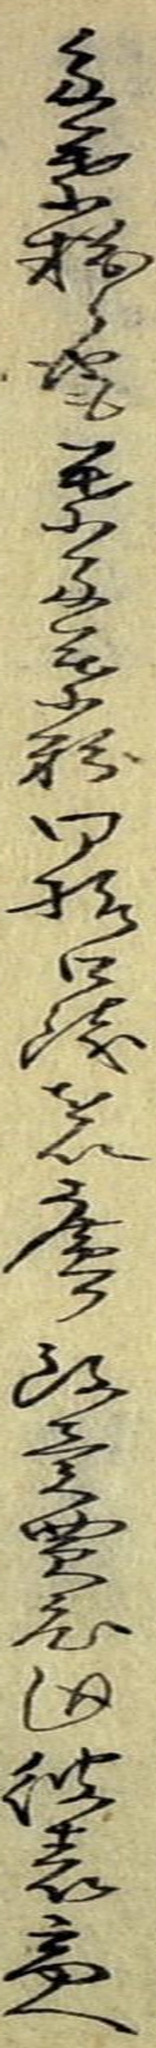た葉粉之儀も葉た葉粉同様口銭を以広ク致売買度趣彼表商人
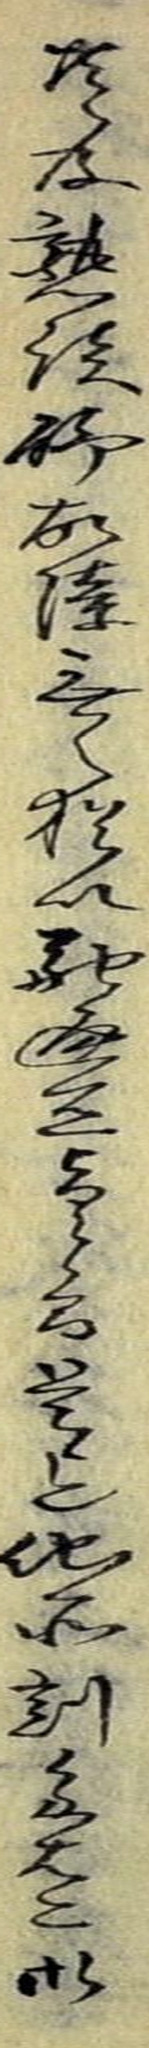共へ及熟談聊故障無之猶以融通宜旨ニ候間是迄他所割たはこ御
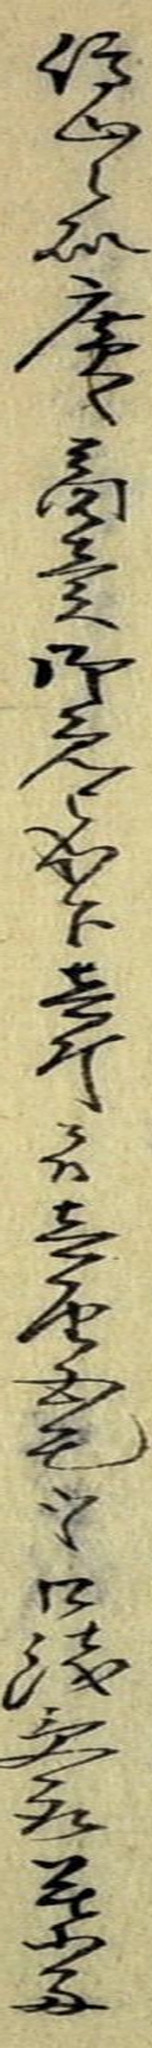停止之処広く商売御免被成下壱斤ニ付壱厘五毛ツヽ口銭受取葉た
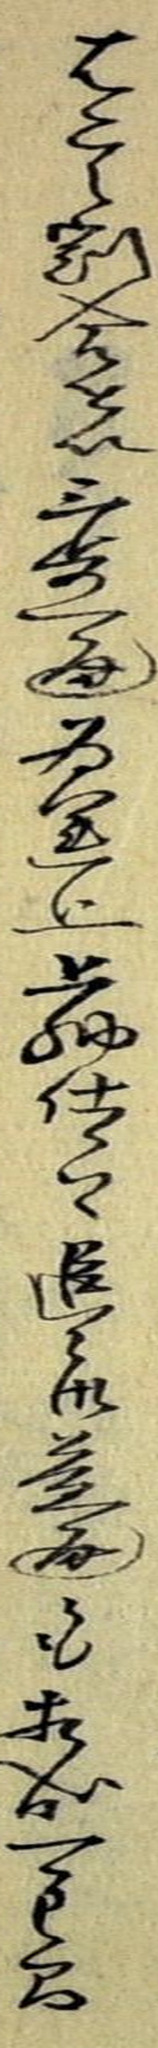はこ之割合を以三歩通為運上上納仕候ハヽ追々益通ニも相成可申候間
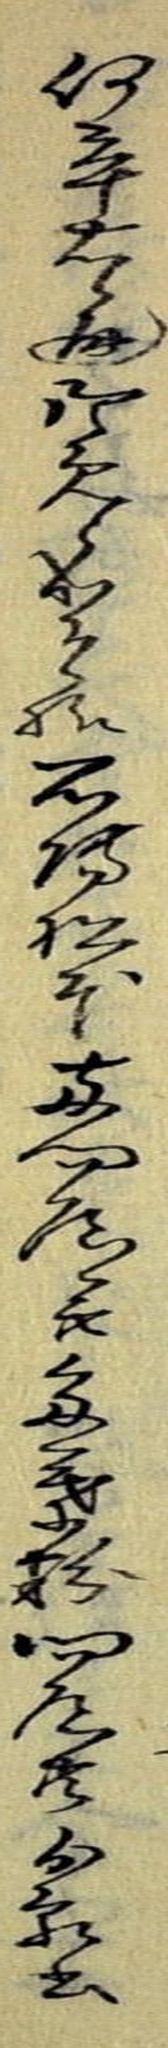何卒右之通御免被成下候様石場松本両問屋并た葉粉問屋共ゟ願書
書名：命令之部 五
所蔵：福井県文書館 Fukui Prefectural Archives
